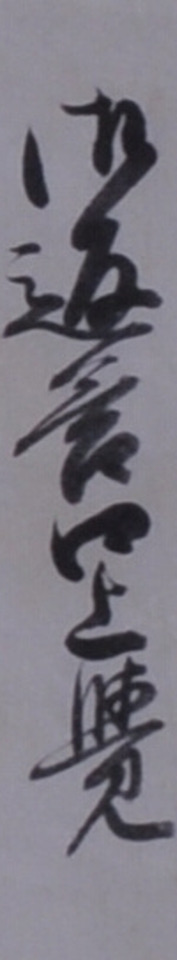御返答口上覚
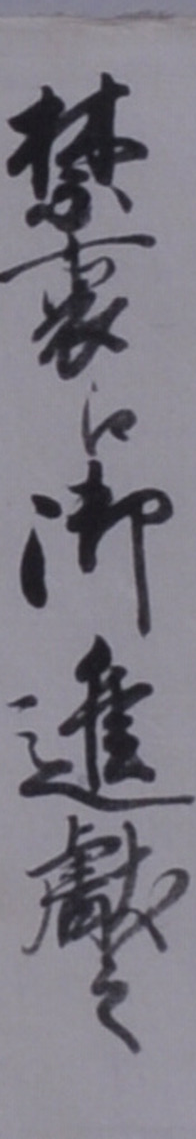禁裏え御進献之
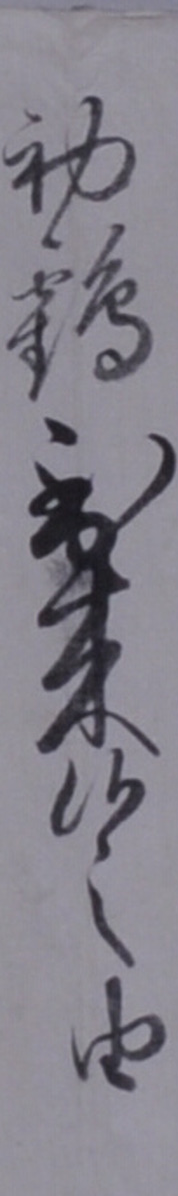初鶴到来候之由
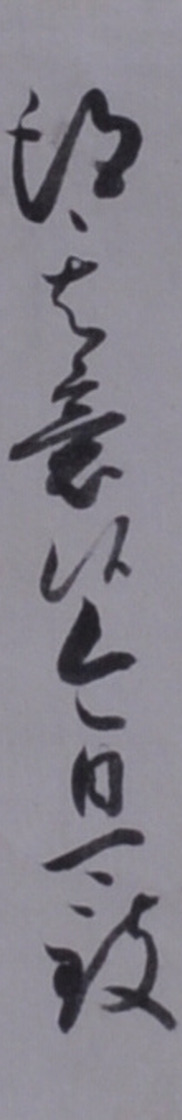得其意候今日可致
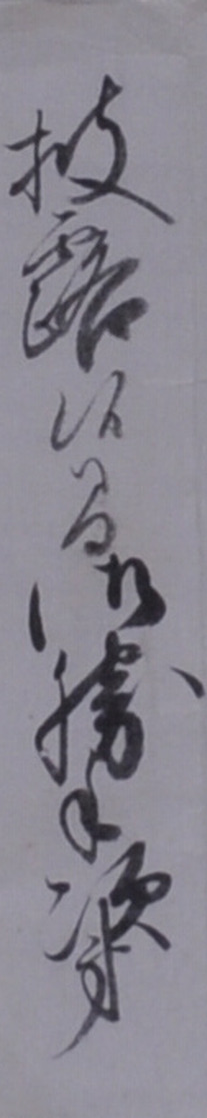披露候間御勝手次第
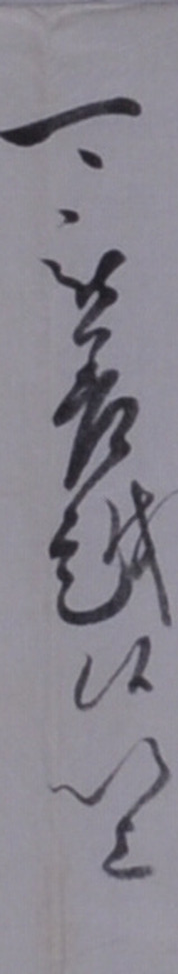可被差越候以上
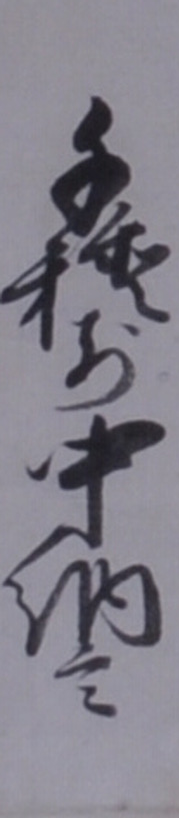千種前中納言
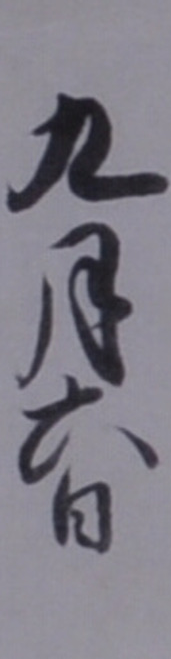九月六日
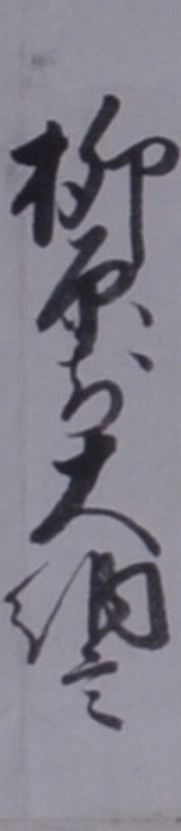柳原前大納言
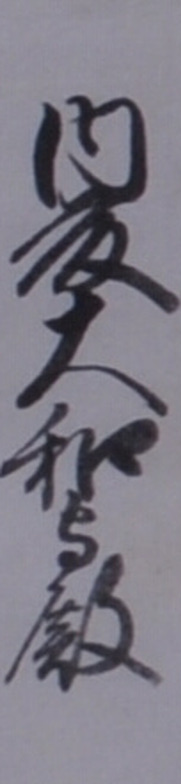内藤大和守殿
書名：御返答口上覚
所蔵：伊那市立高遠町図書館・合同会社AMANE
